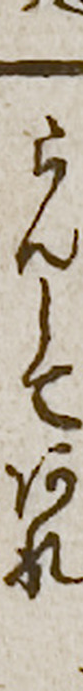らんしてあれ
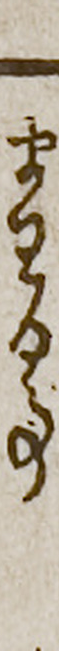まわる事
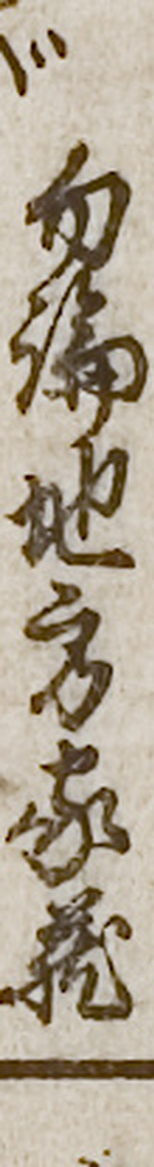勿論地方家蔵
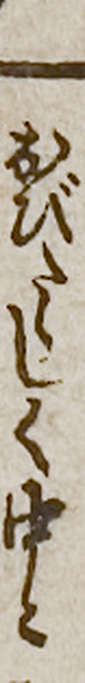おびたゝしく中々
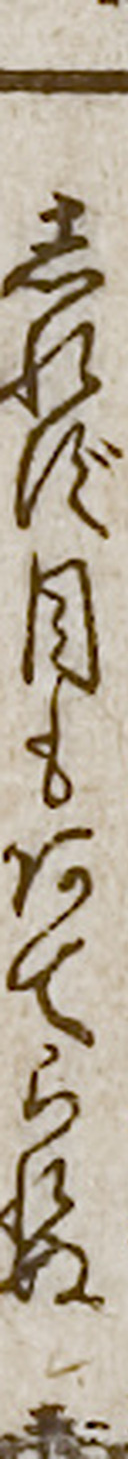しれず目もあてられぬ
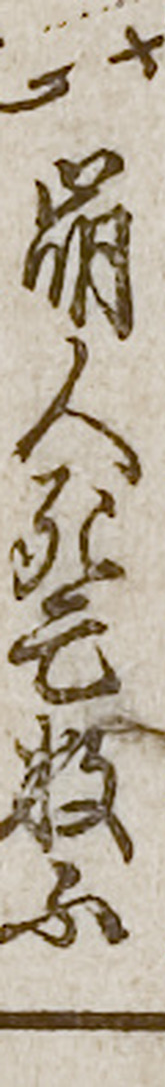崩人死亡数不
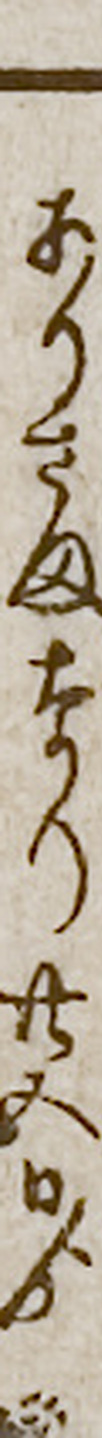ありさまなり廿五日より
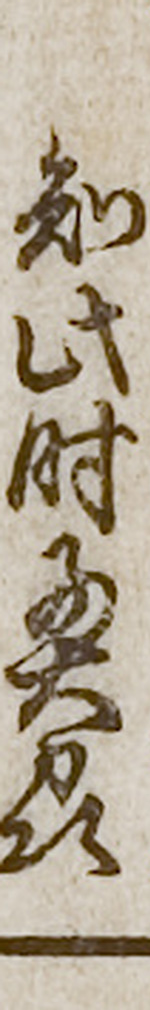知此時奥州
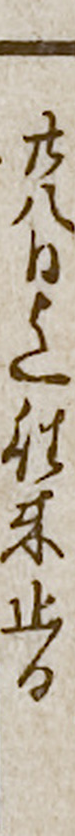廿八日迄往来止る
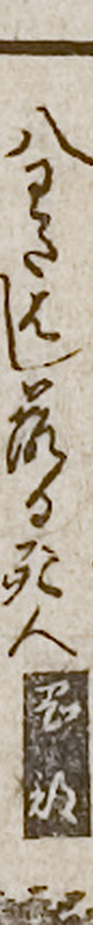八わたはし落る死人
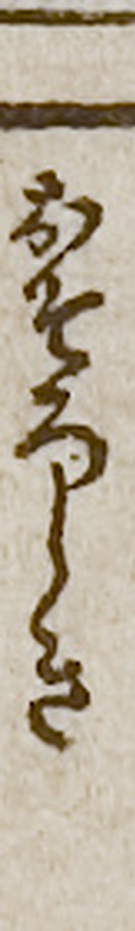おそろしき
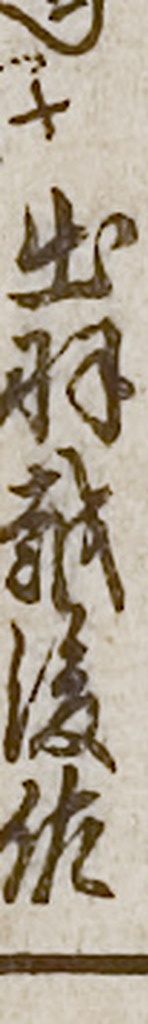出羽越後佐
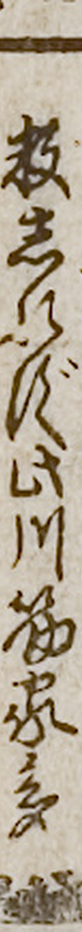数しれず此川筋家多
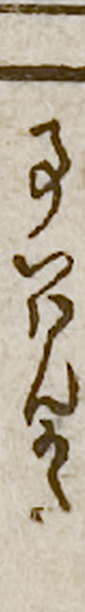事いはんかた
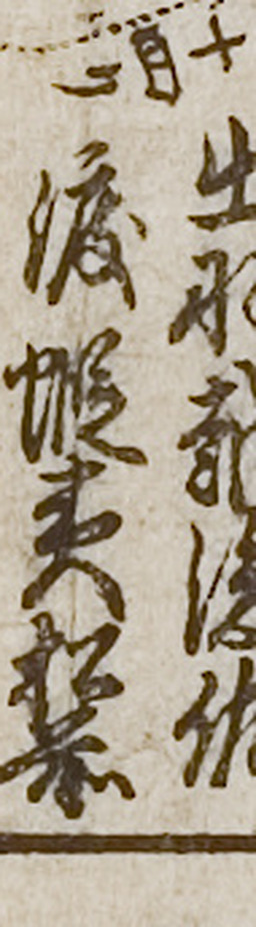渡蝦夷松前
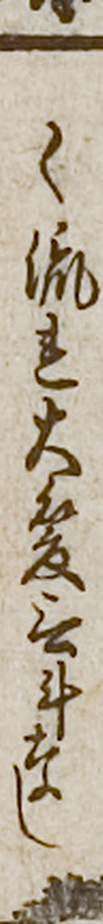く流れ大変云斗なし
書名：江戸東海道東国荒珍事図
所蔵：東京大学総合図書館 General Library in the University of Tokyo, JAPAN
